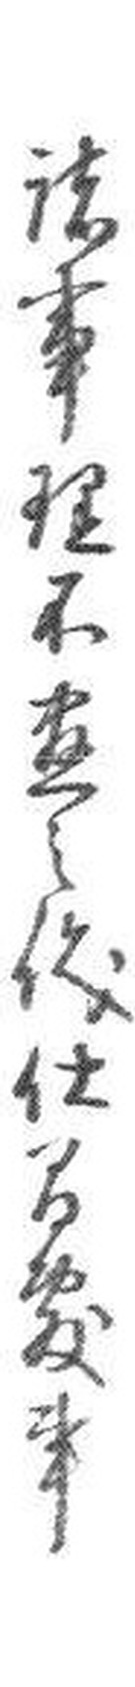諸事理不尽之儀仕間敷事
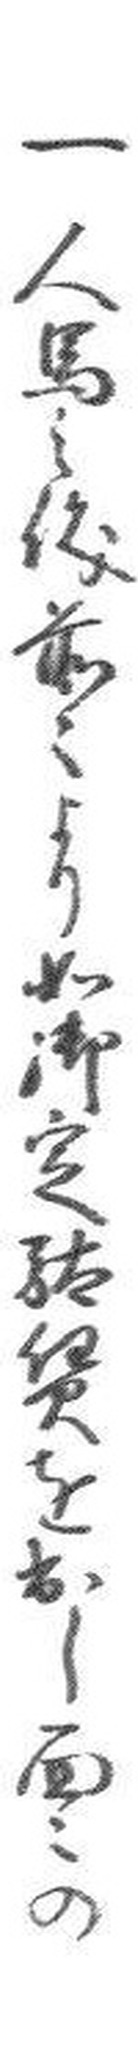一人馬之儀前々より如御定駄賃を出し面々の
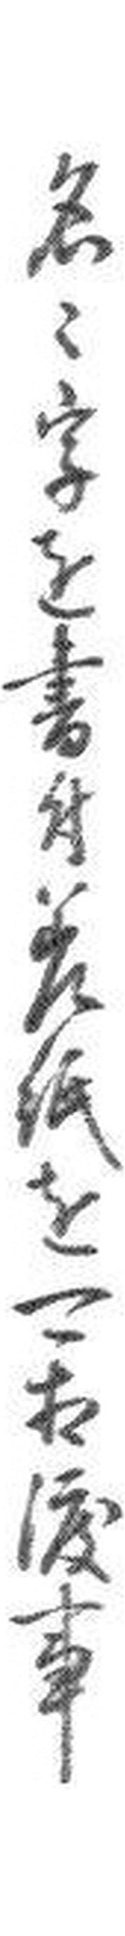名々字を書付差紙を可相渡事
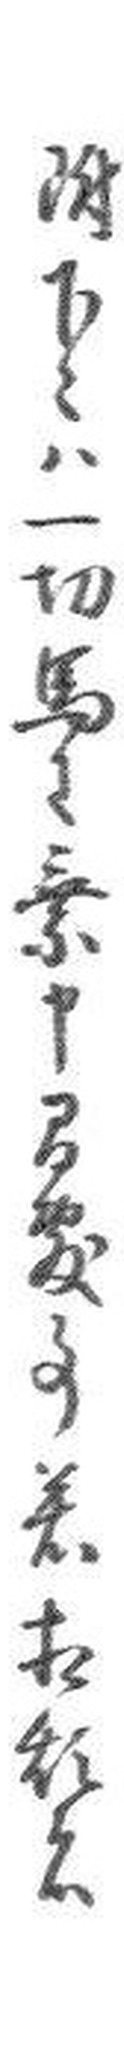附下々ハ一切馬に乗間敷事若相煩者
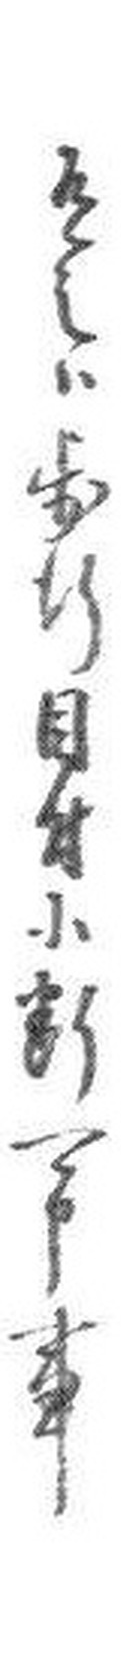有之ハ歩行目付に断可申事
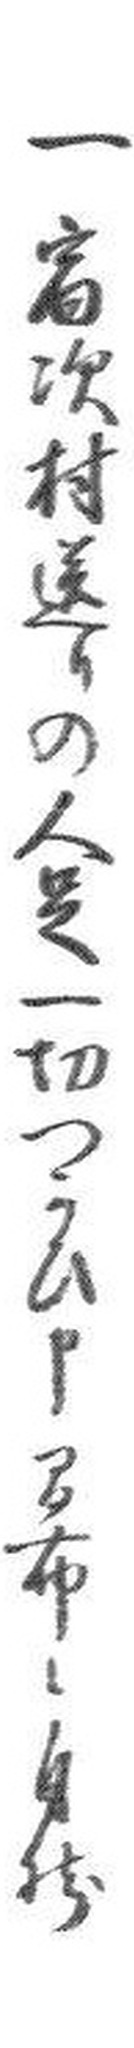一宿次村送リの人足一切つかひ申間布候自然
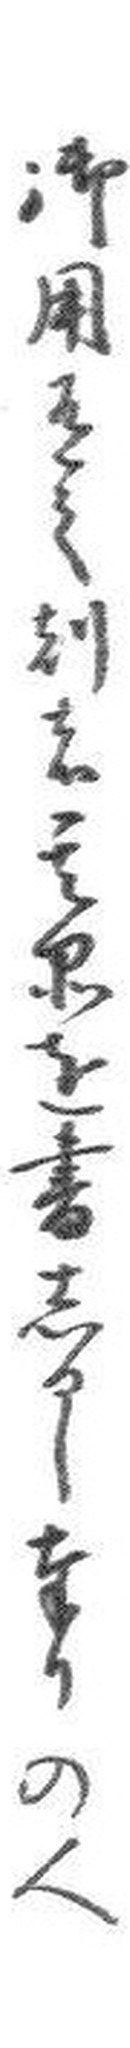御用有之刻者其品を書しるし奉りの人
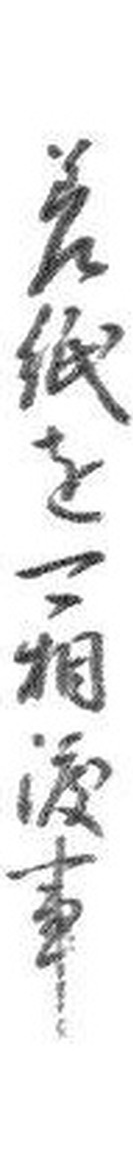差紙を可相渡事

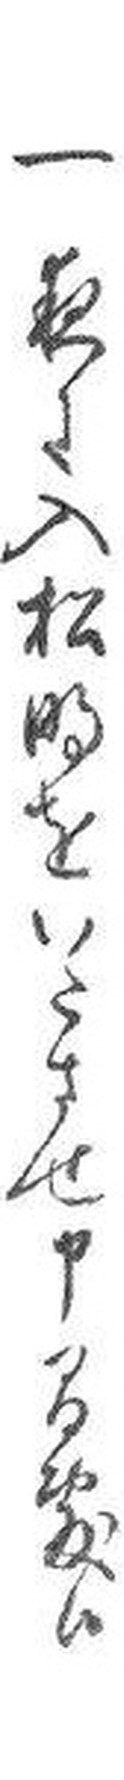一夜に入松明をいたさせ申間敷候
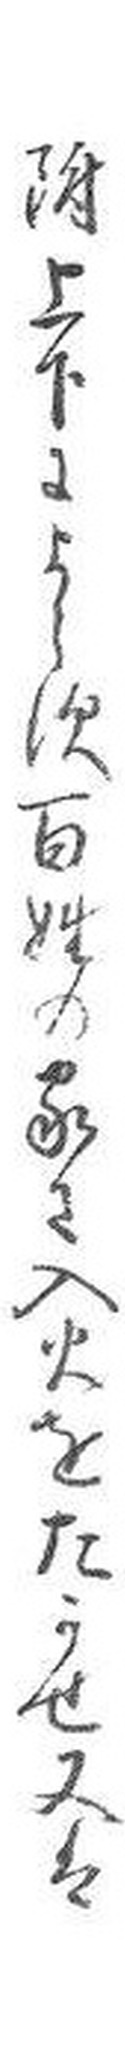附上下によらす百姓の家に入火をたかせ又は
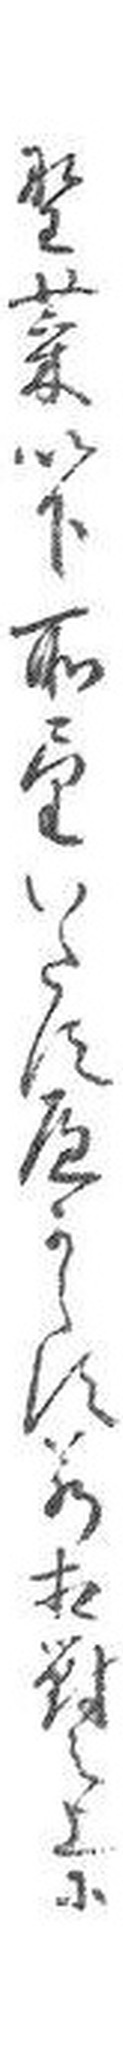野菜以下所望いたすへからす若相対之上に
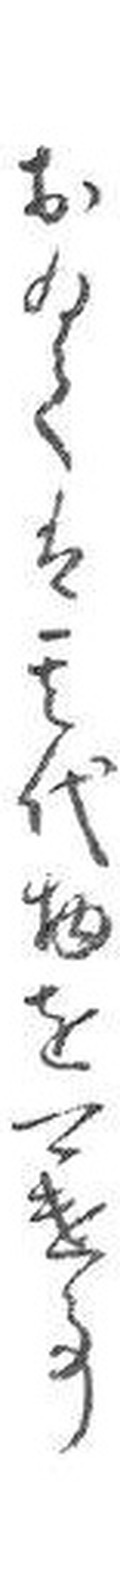おゐては其代物を可遣事
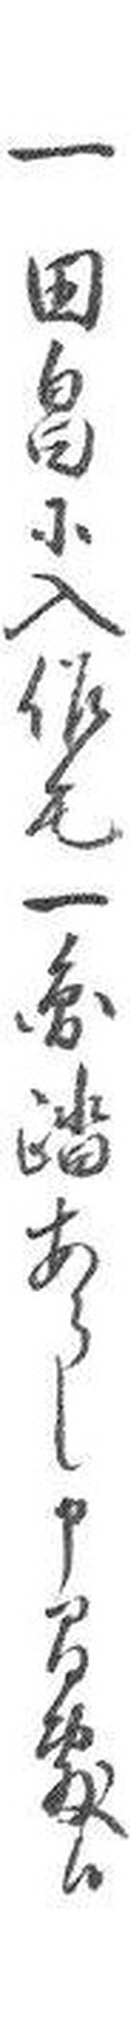一田畠に入作毛一円踏あらし申間敷候
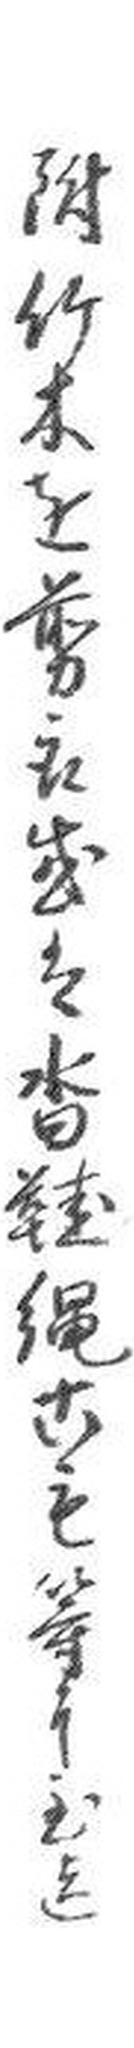附竹木を剪取或は沓鞋縄こも等に至迄
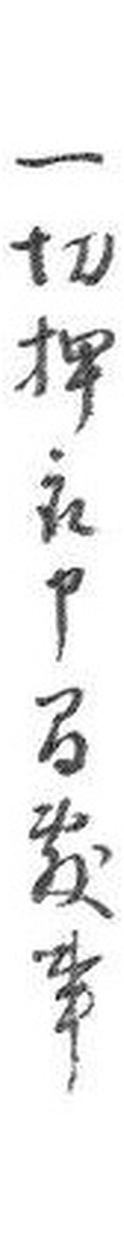一切押取申間敷事
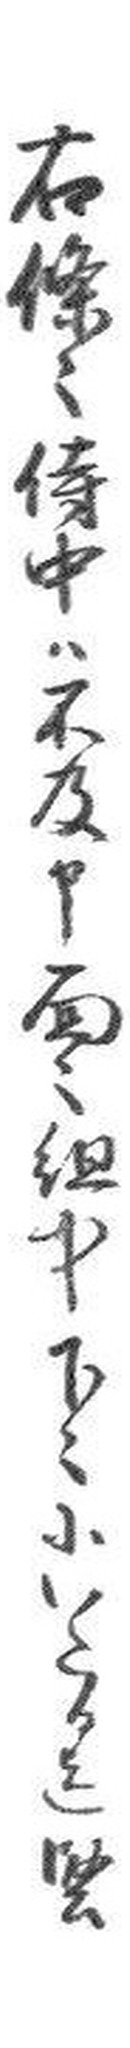右条々侍中ハ不及申面々組中下々にいたる迄堅
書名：家譜 五 光通公 従寛永十三年到万治二年
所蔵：福井県文書館 Fukui Prefectural Archives
